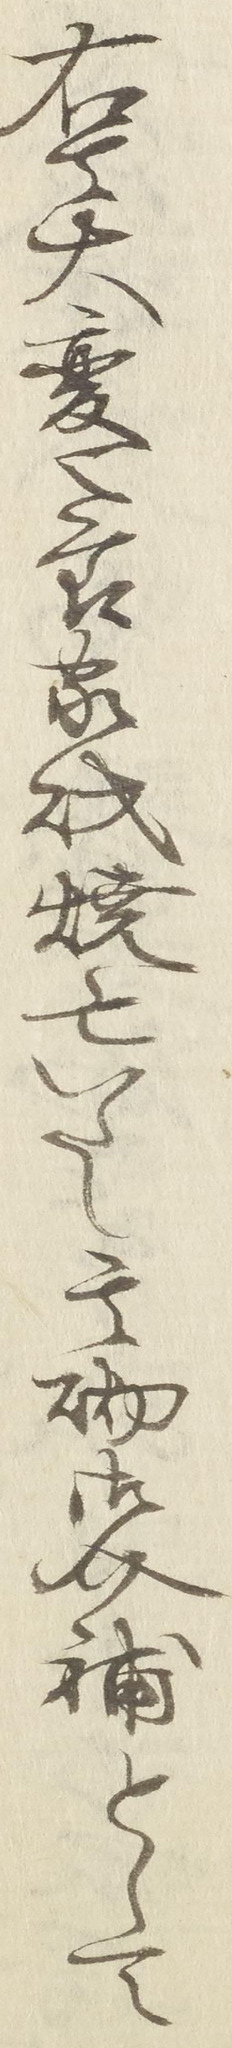右は大変之節家財焼亡いたし其砌御介補として
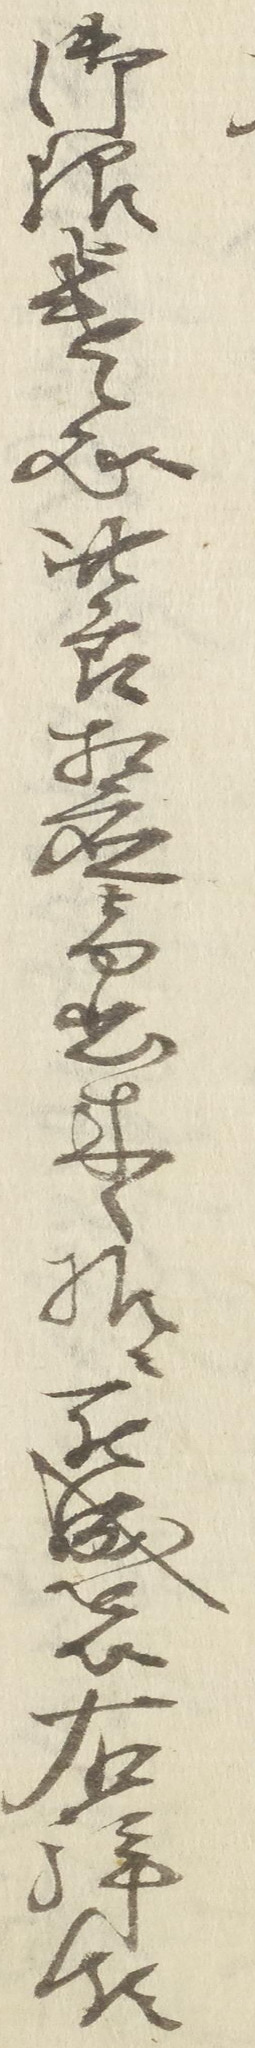御銀被遣候処此節相応二而出来候様に罷成を以右拝領

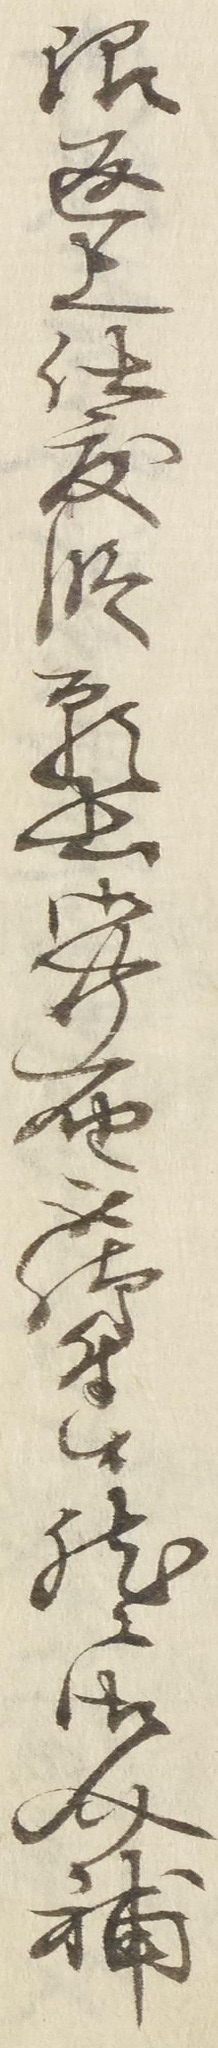銀返上仕度段願出御聞届被仰付候然二御介補
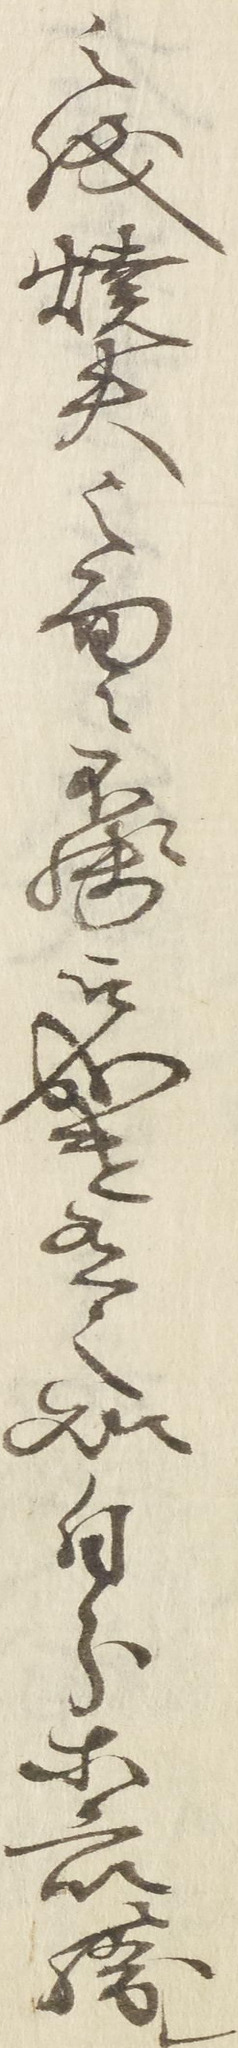之儀焼失之面々不残被成遣有之処自分等衆二勝ㇾ
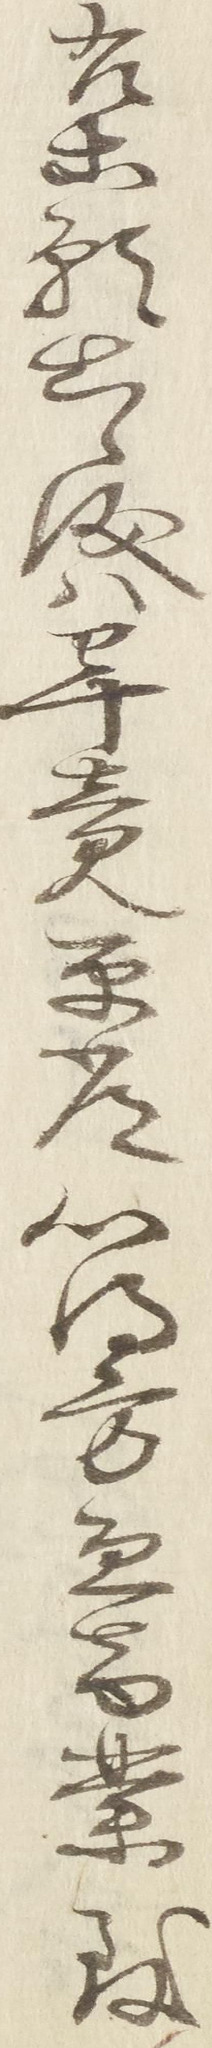右等願出候儀は畢竟平常心得方至商業致
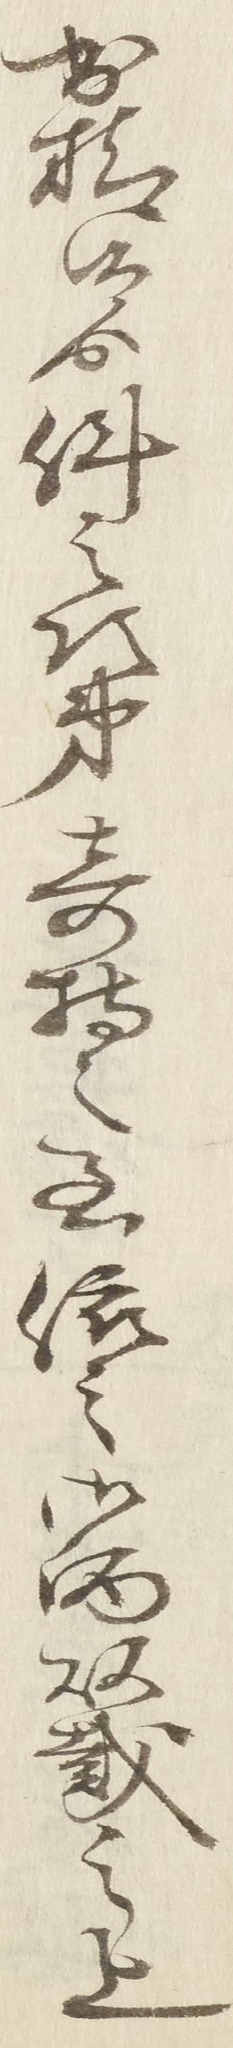出精候ゟ件之次第奇特之至依之御酒頂戴之上
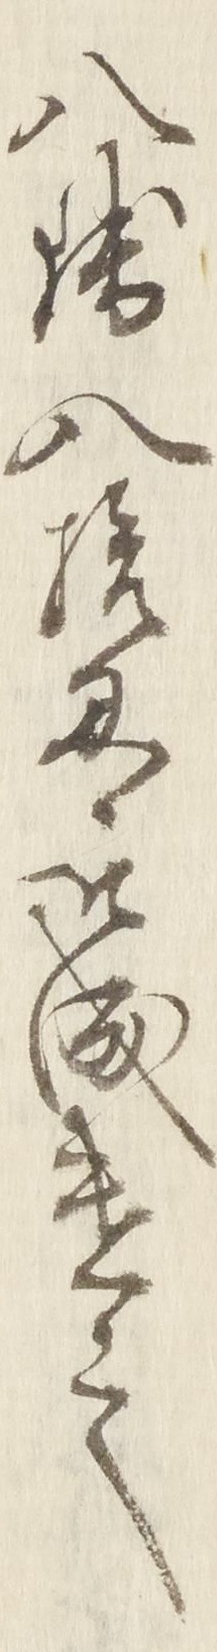八銭八拾両匁被成遣之
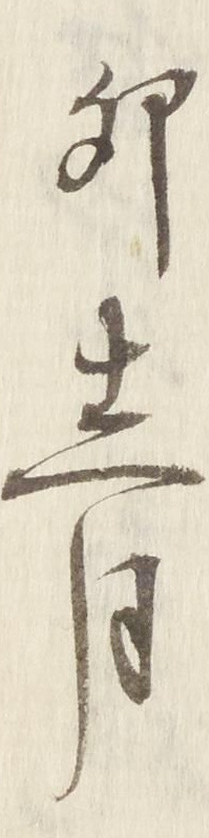卯十二月
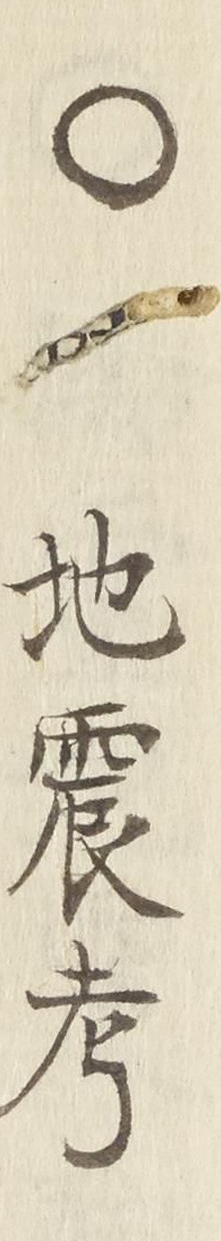◯地震考
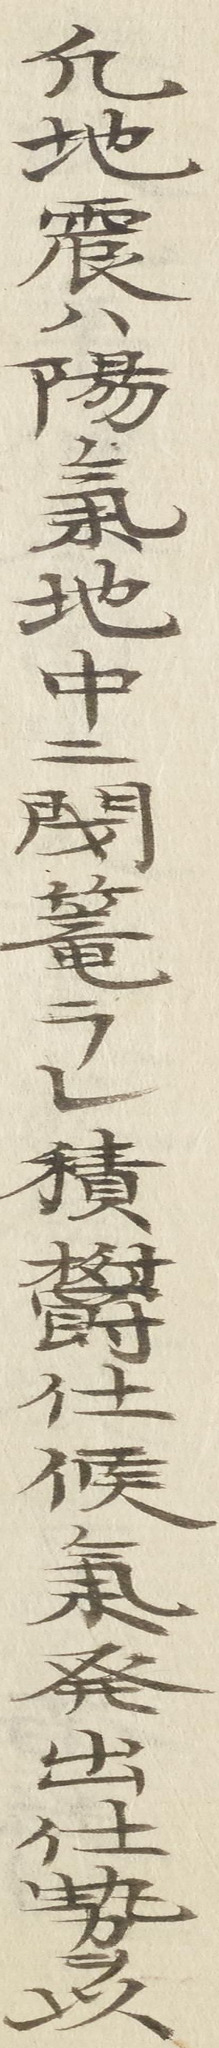凡地震は陽気地中に閉篭られ積欝仕候気発出仕勢を以
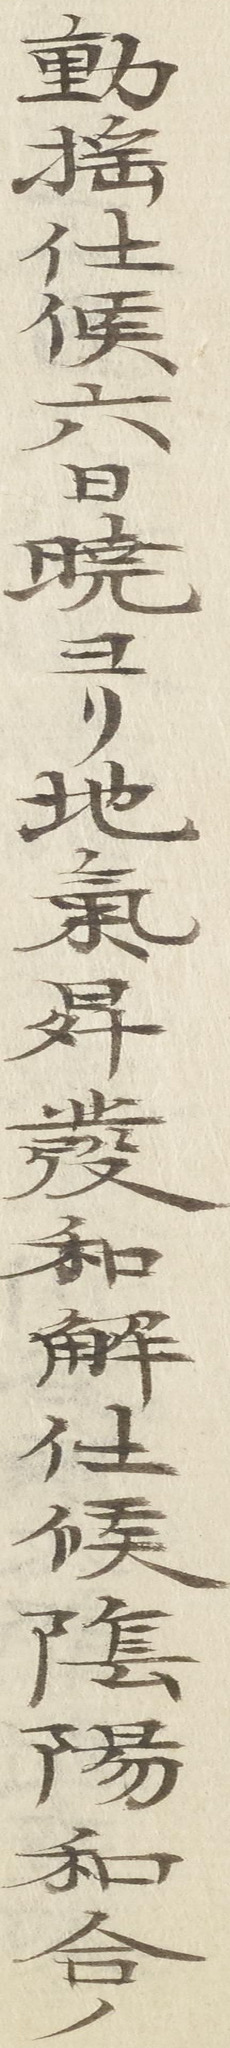動揺仕候六日暁より地気昇発和解仕候陰陽和合の
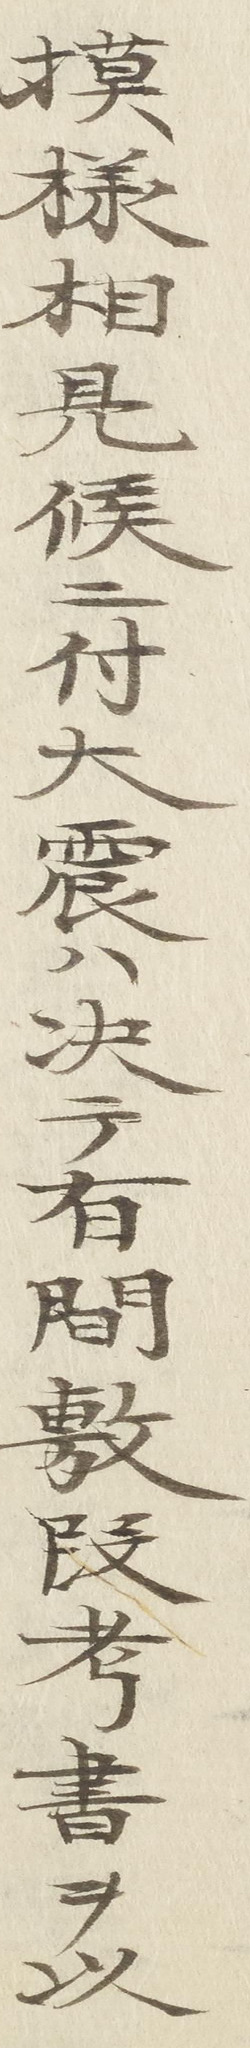模様相見候に付大震は决て有間敷段考書を以
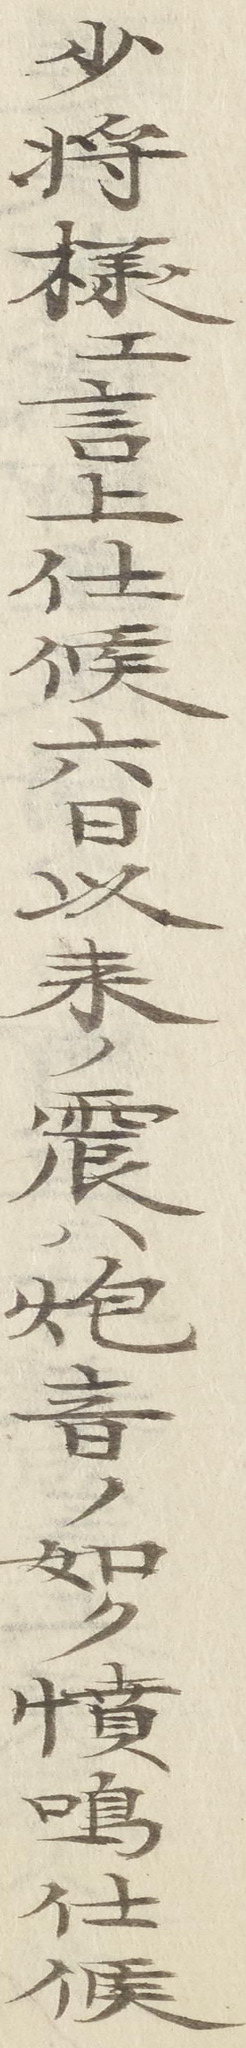少将様え言上仕候六日以来震は炮音の如く噴鳴仕候
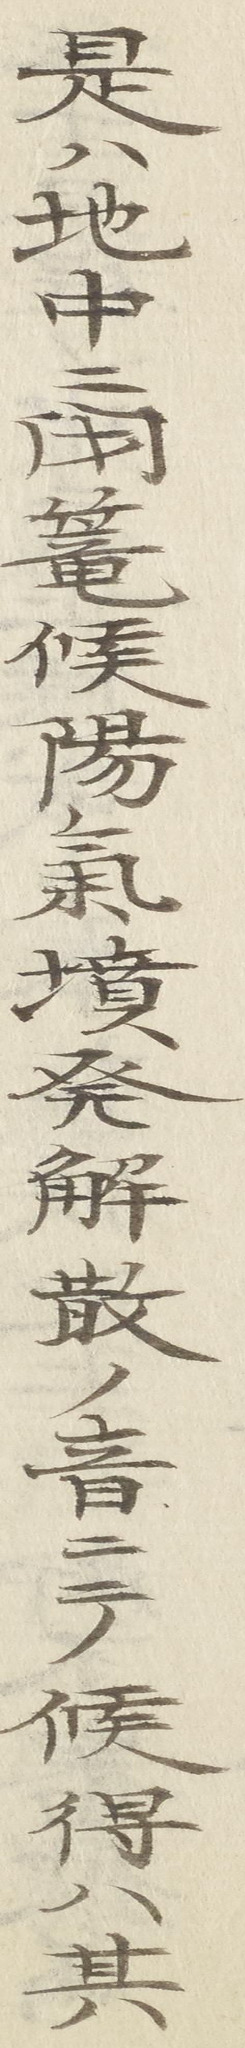是は地中に閉篭候陽気噴発解散の音にて候得は其
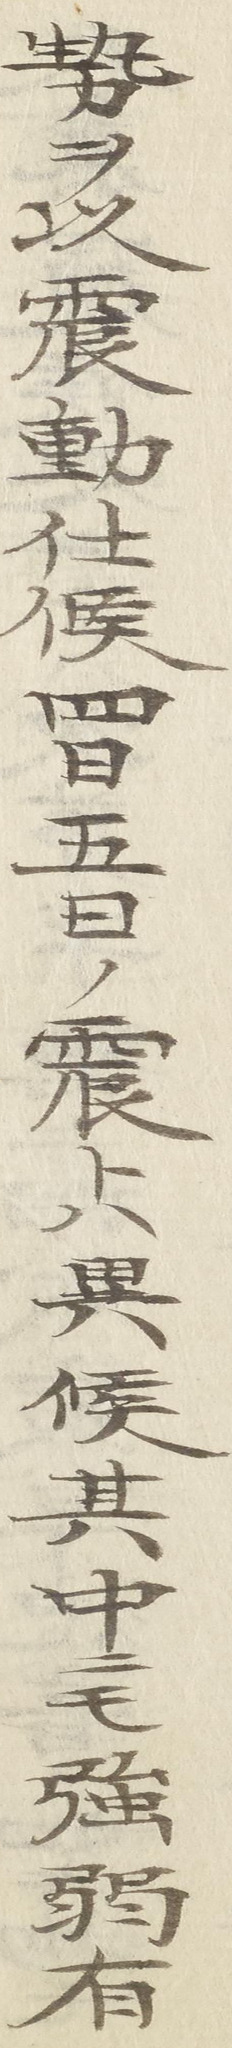勢を以震動仕候四日五日の震とは異候其中にも強弱有
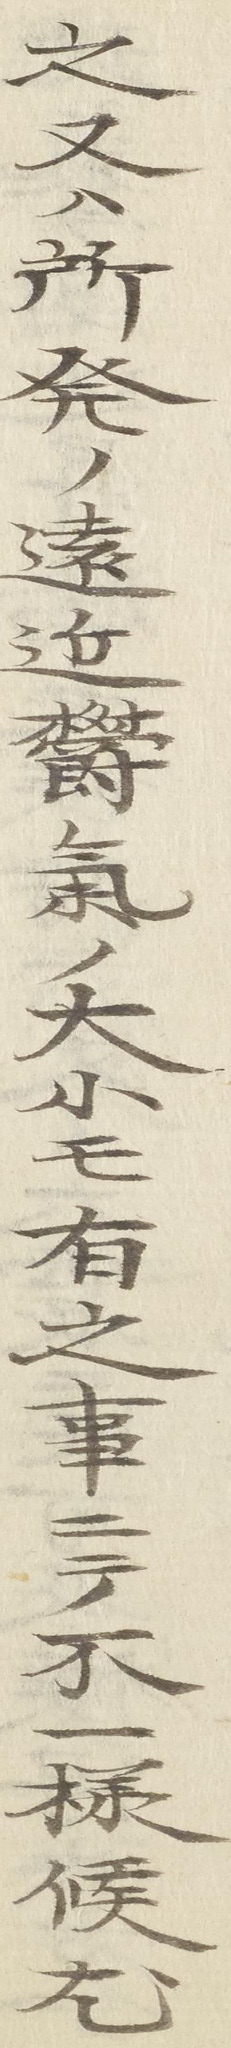之又は所発の遠近欝気の大小も有之事にて不一様候尤
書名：地震記　下
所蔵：東京大学地震研究所図書室 Earthquake Research Institute Library, The University of Tokyo, JAPAN
